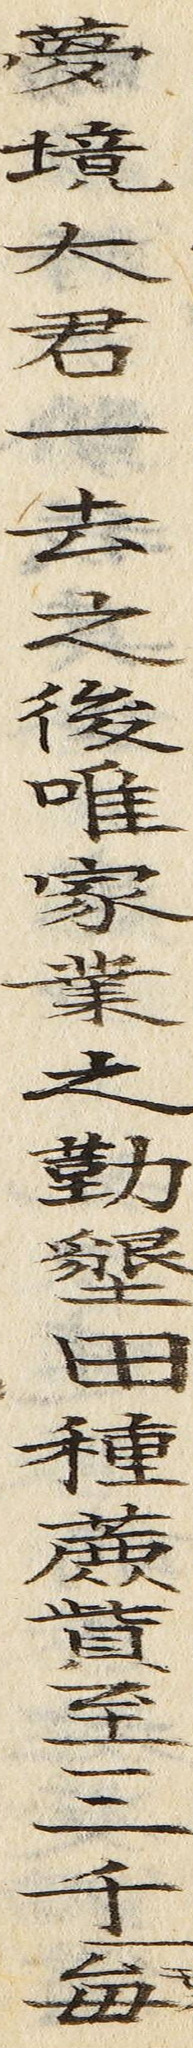夢境大君一去之後唯家業之勤墾田種蔗貲至三千「毎
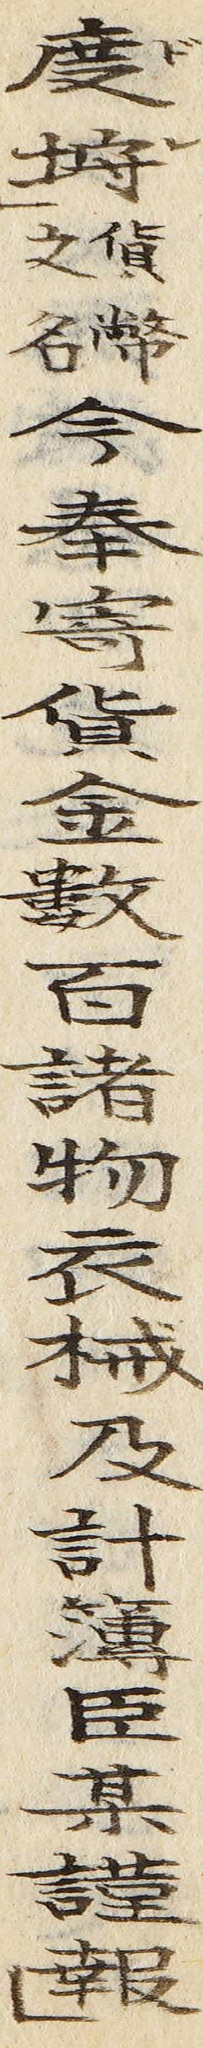度垨」貨幣之名今奉寄貨金数百諸物衣械及計簿臣某謹報」
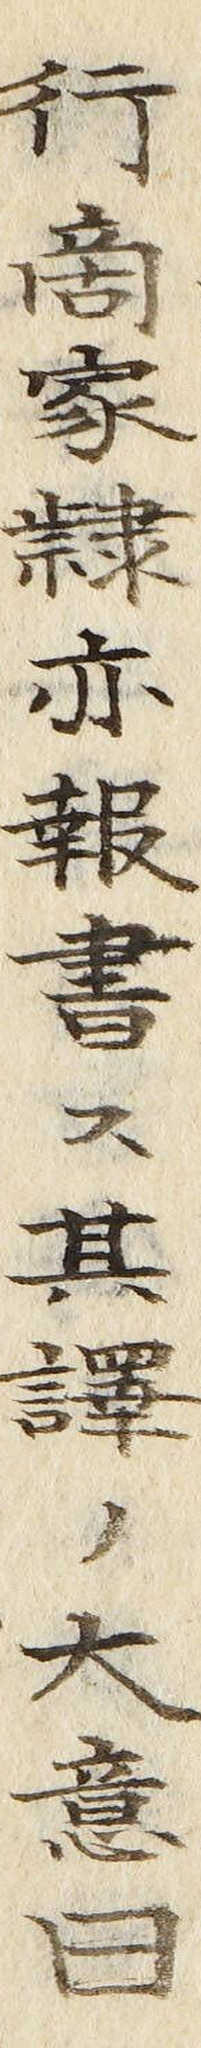行商家隷亦報書ス其訳ノ大意曰
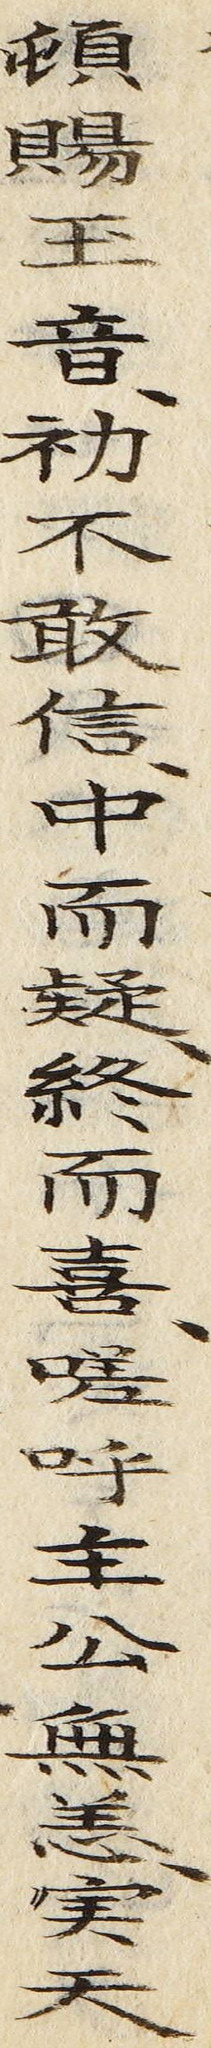頓賜玉音、初不敢信、中而疑、終而喜、嗟呼主公無恙、実天
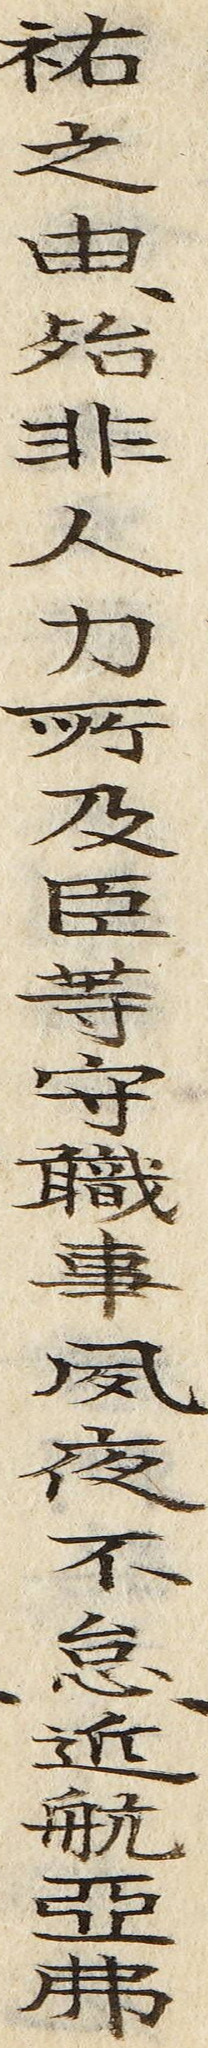祐之由、殆非人力所及臣等守職事夙夜不怠、近航亜弗
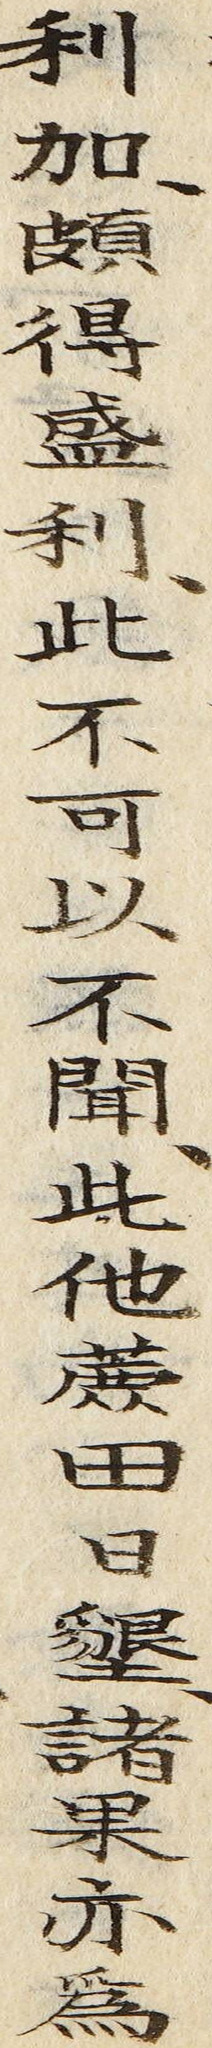利加、頗得盛利、此不可以不聞、此他蔗田日墾、諸果亦為
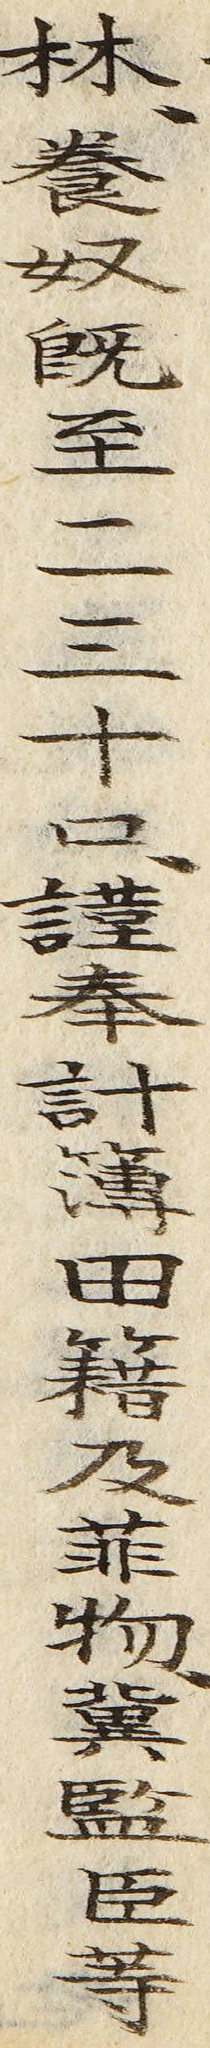林、養奴既至二三十口、謹奉計簿田籍及菲物、冀監臣等
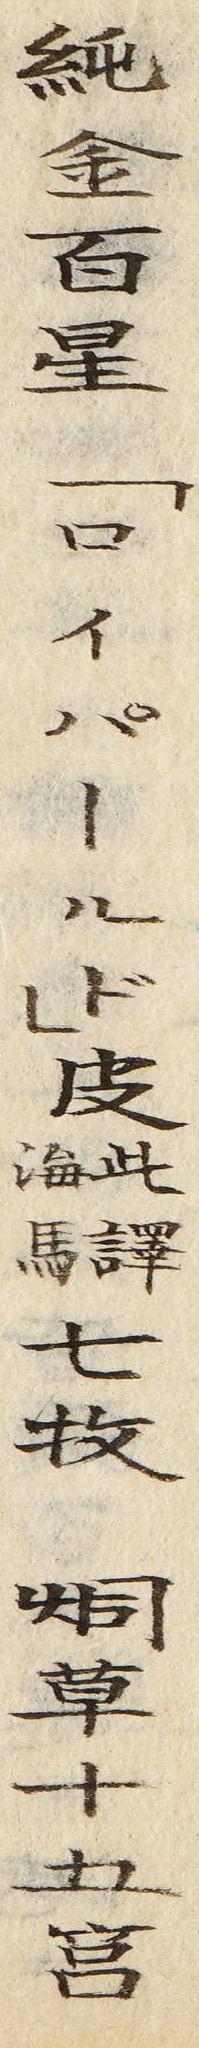純金百星「ロイパールド」皮此訳海馬七枚煙草十五筥
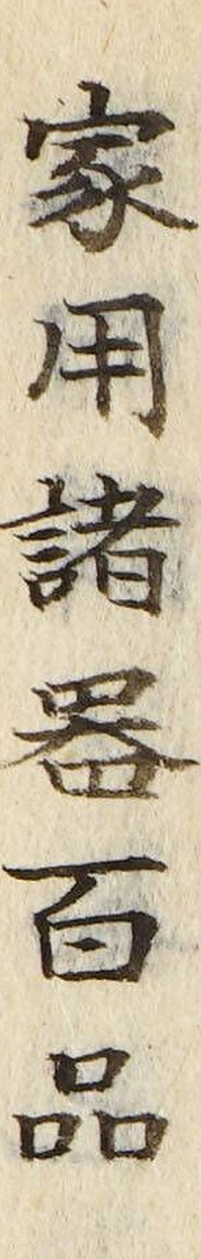家用諸器百品

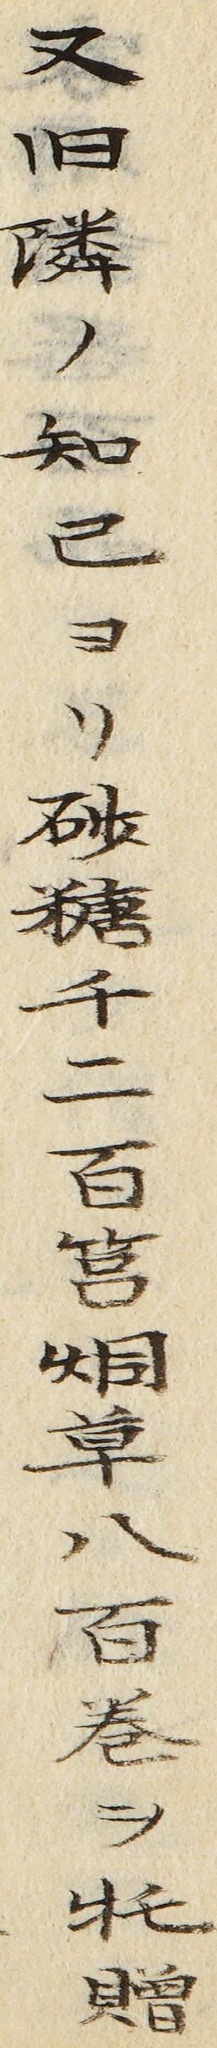又旧隣ノ知己ヨリ砂糖千二百筥煙草八百巻ヲ托贈
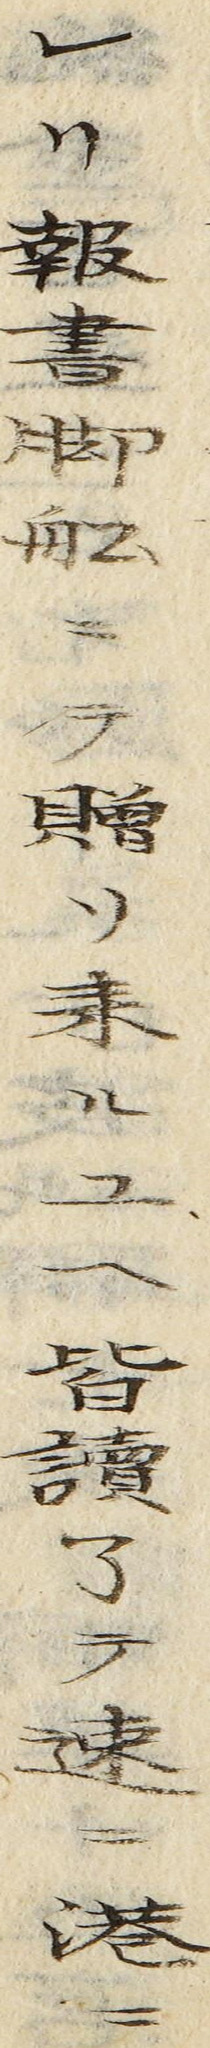レリ報書脚船ニテ贈リ来ルユヘ皆読了テ速ニ港ニ
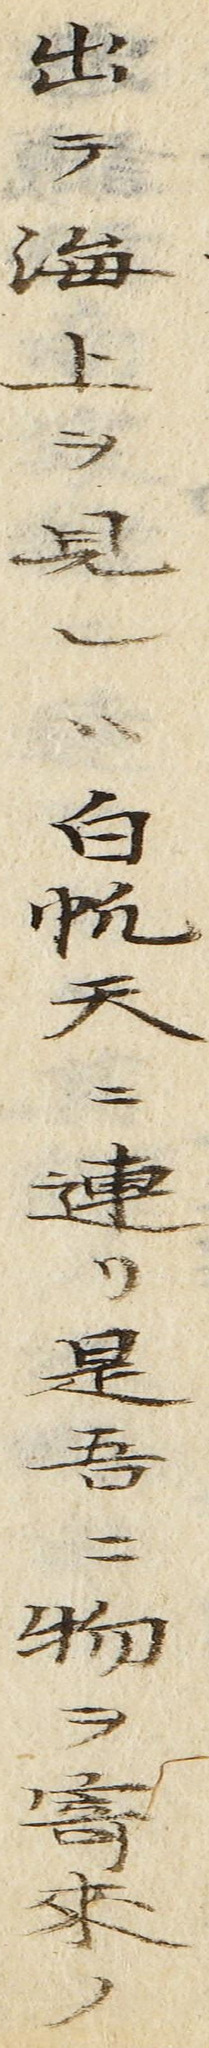出テ海上ヲ見レハ白帆天ニ連リ是吾ニ物ヲ寄来ノ
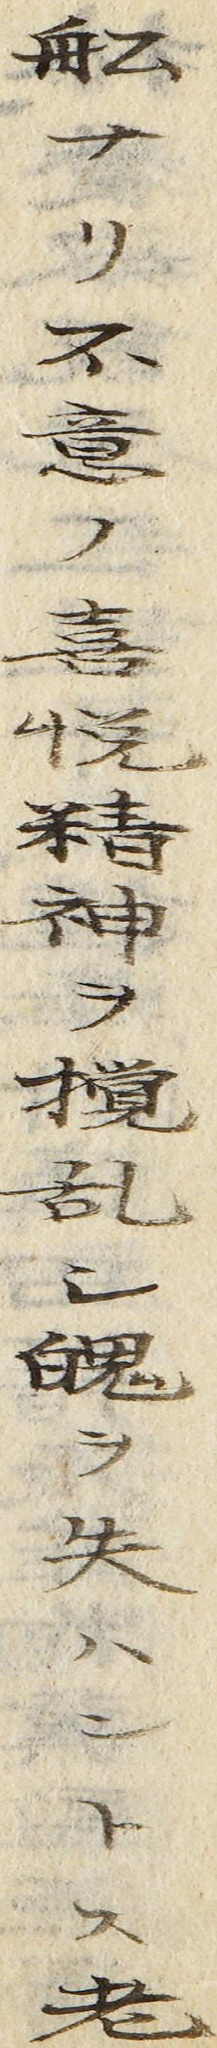船ナリ不意ノ喜悦精神ヲ撹乱シ魄ヲ失ハントス老
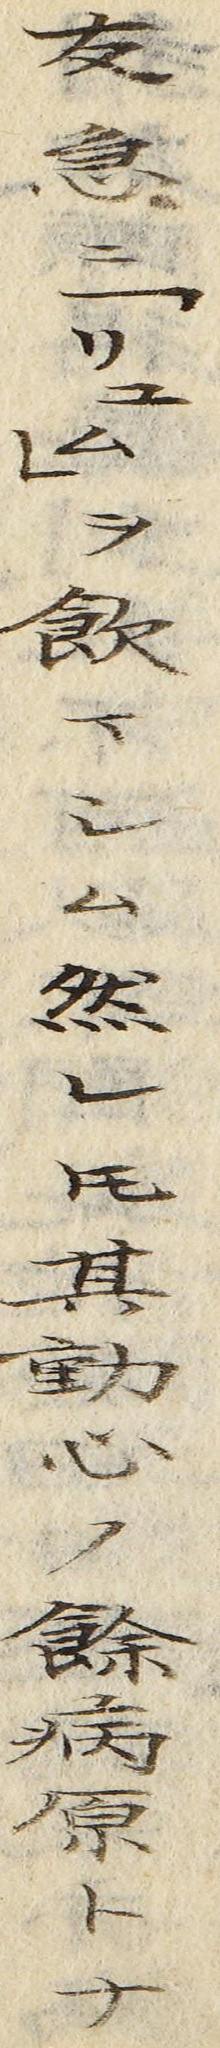友急ニ「リュム」ヲ飲マシム然レトモ其動心ノ余病原トナ
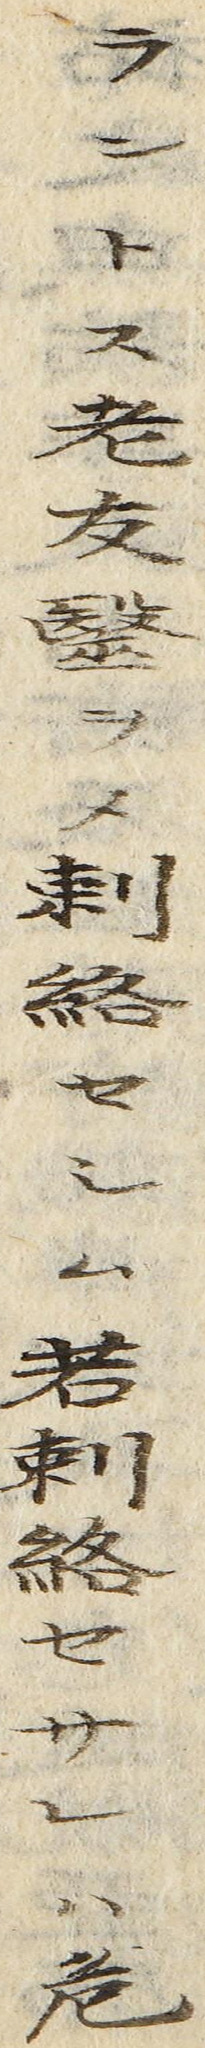ラントス老友医ヲシテ刺絡セシム若刺絡セサレハ危
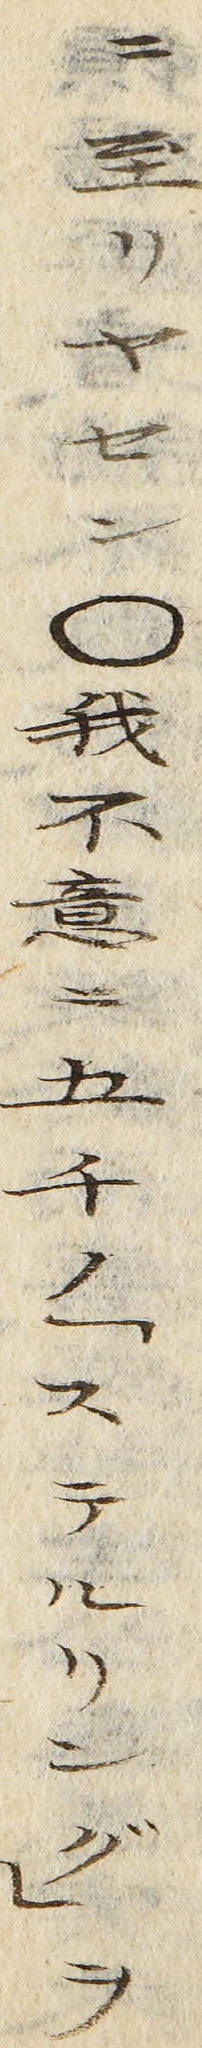ニ至リヤセン◯我不意ニ五千ノ「ステルリング」ヲ
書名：漂流紀事
